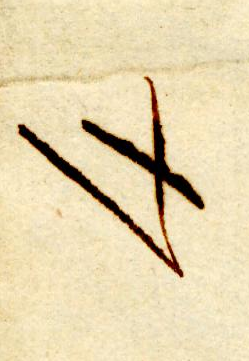4
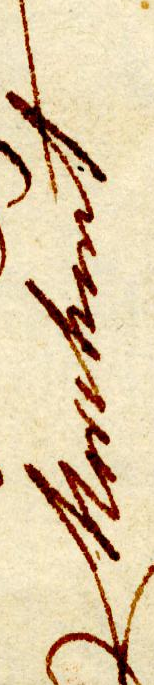Merchant
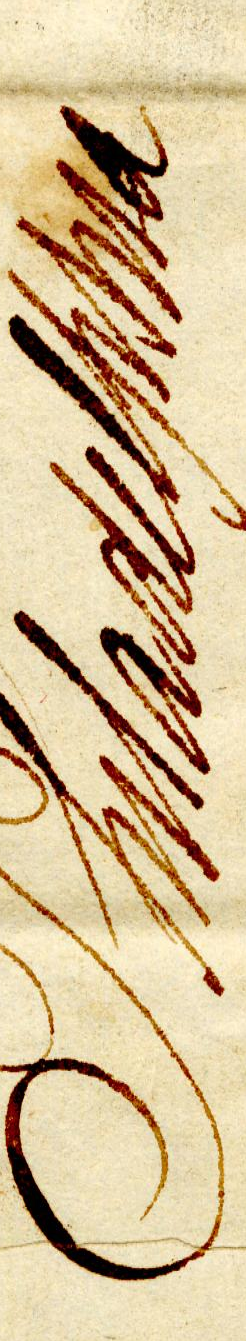Philadelphia
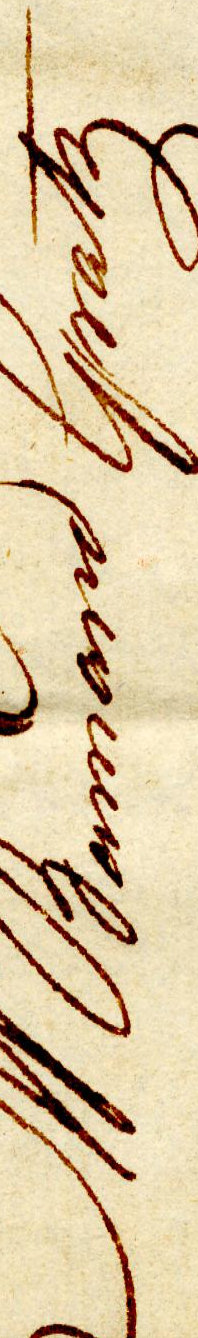M^r Barnard Gratz
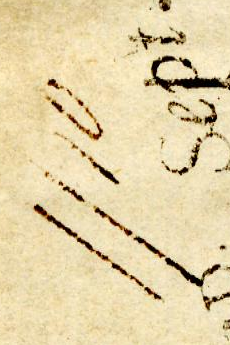11 10
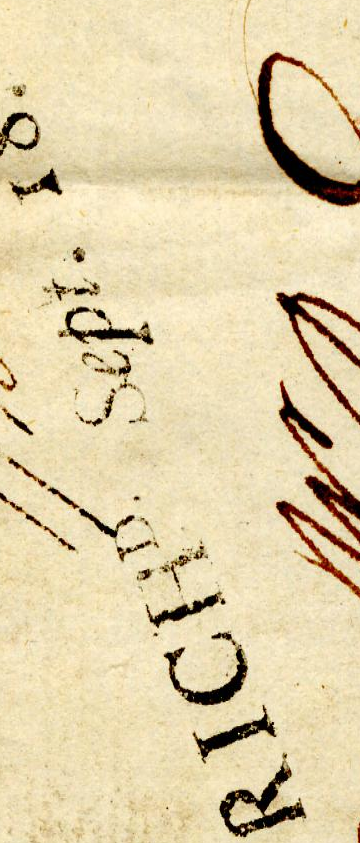RICH Sept. 18
